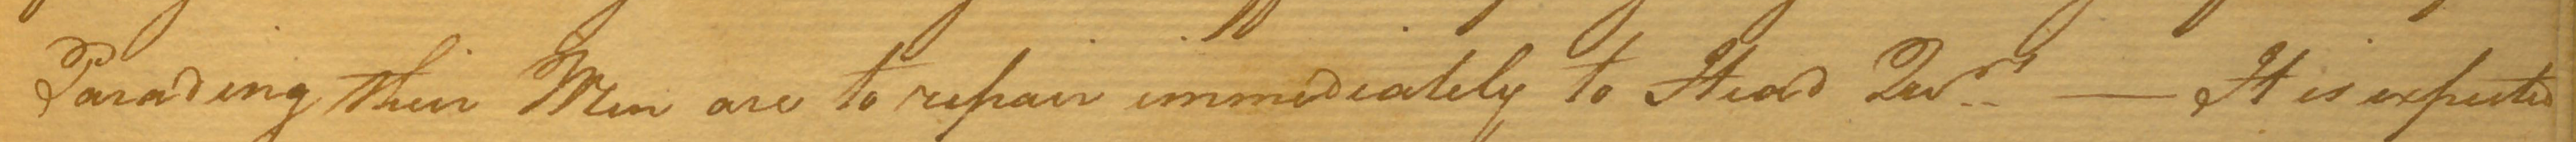Parading their Men are to repair immediately to Head Qu^rs.- It is expected
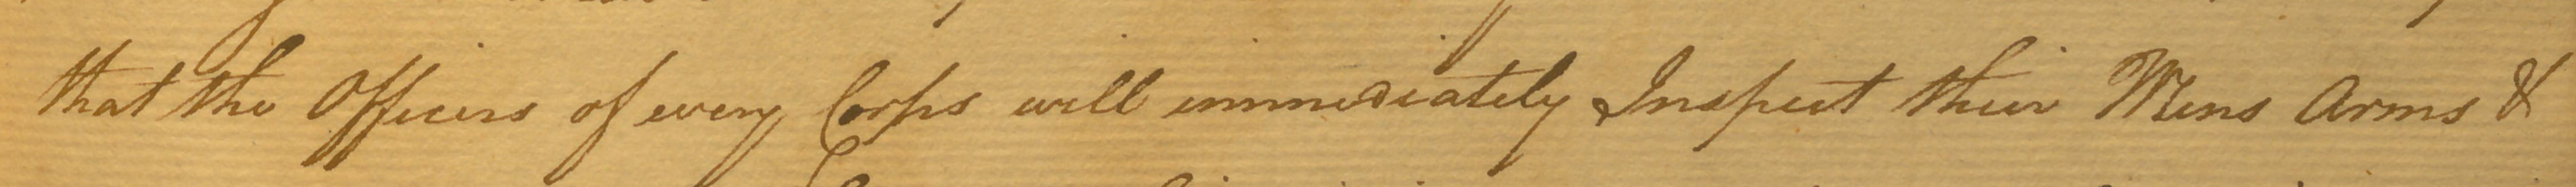that the Officers of every Corps will immediately Inspect their Mens Arms &
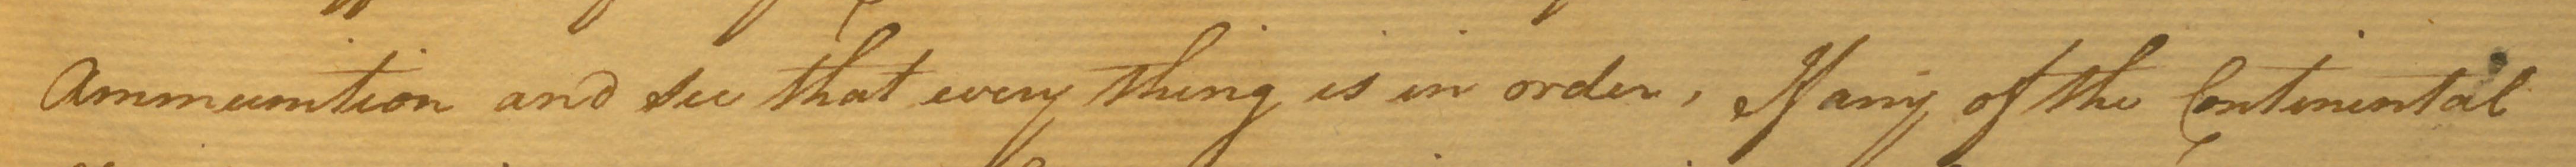Ammunition and see that every thing is in order, If any of the Continental
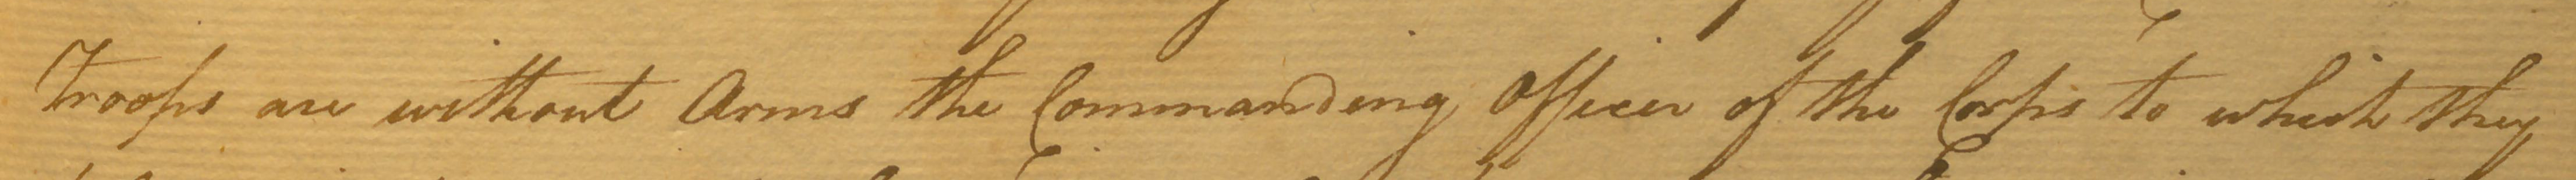Troops are without Arms the Commanding Officer of the Corps to which they
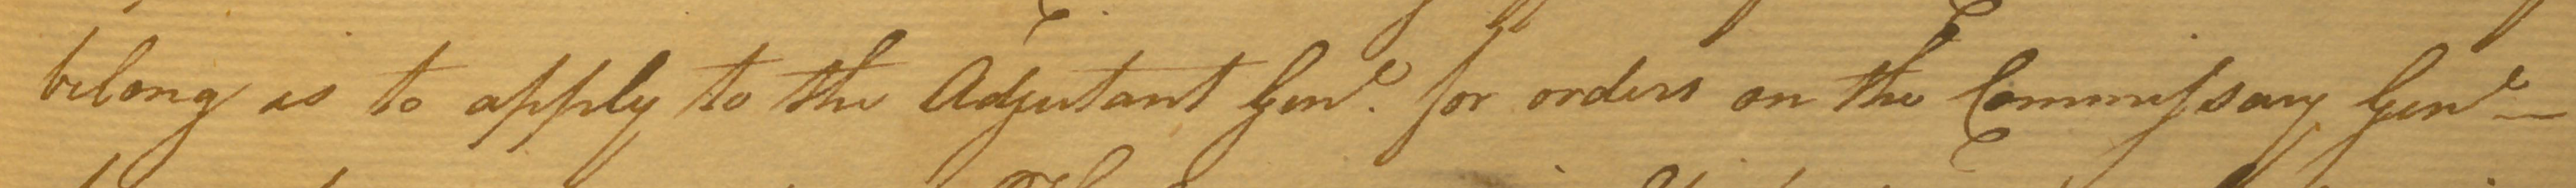belong is to apply to the Adjutant Gen^l. for orders on the Commissary Gen^l-
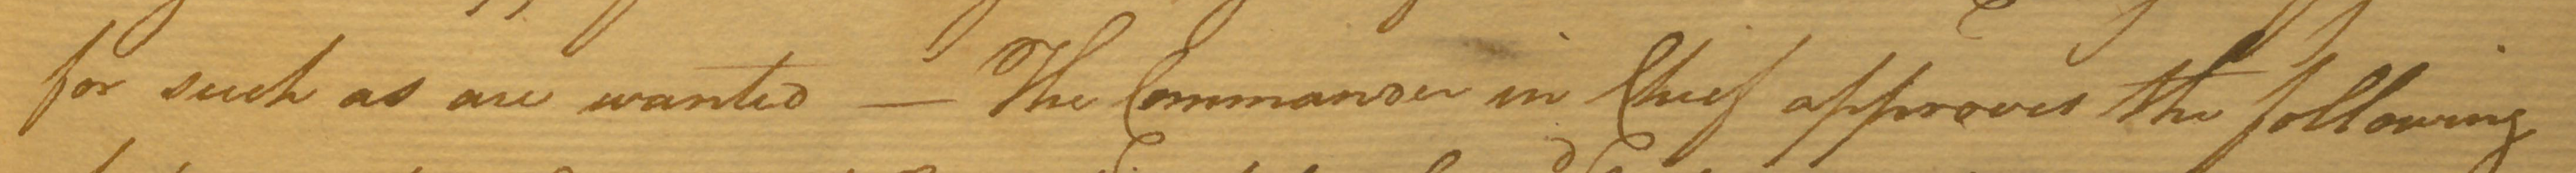for such as are wanted- The Commander in Chief approves the following
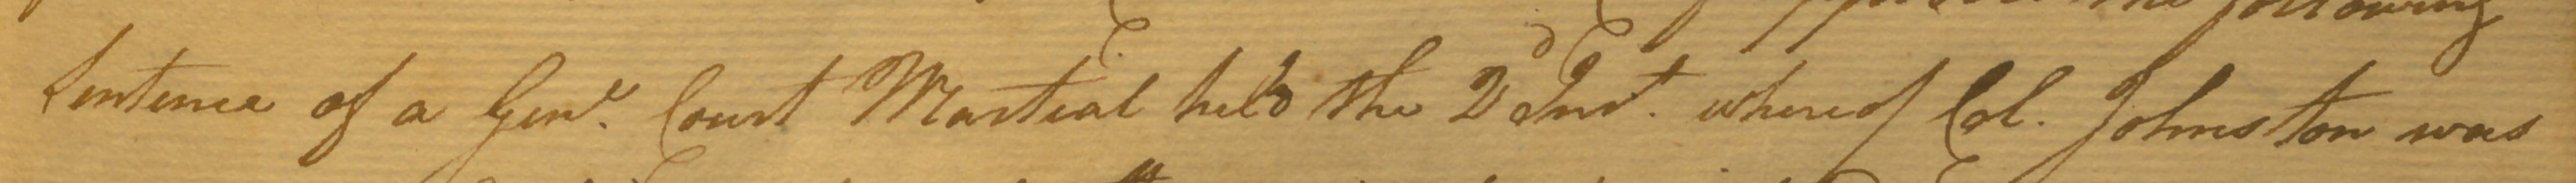Sentence of a Gen^l. Court Martial held the 2^d Ins^t. whereof Col. Johnston was
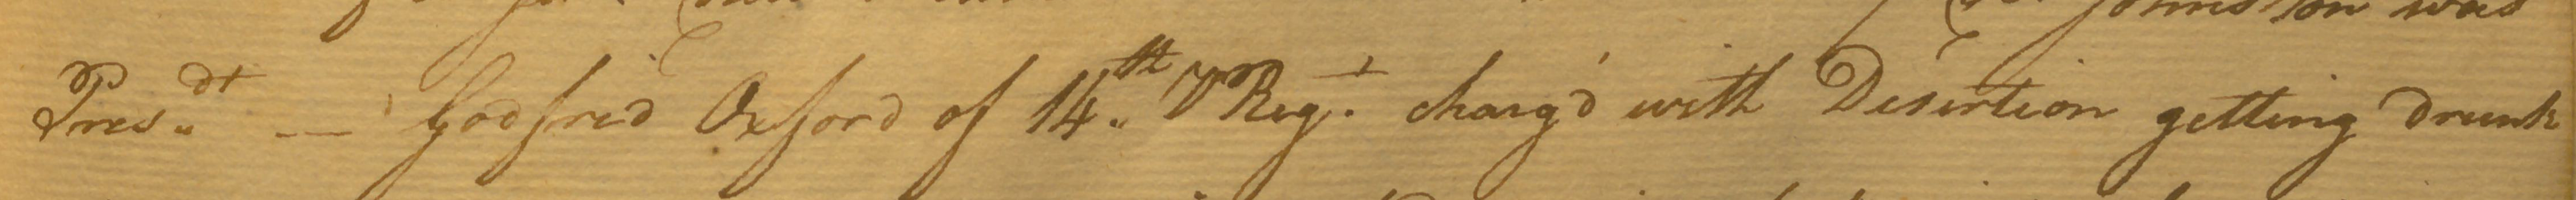Pres^dt.- Godfrid Oxford of 14^th. V Reg^t. charg'd with Desertion getting drunk
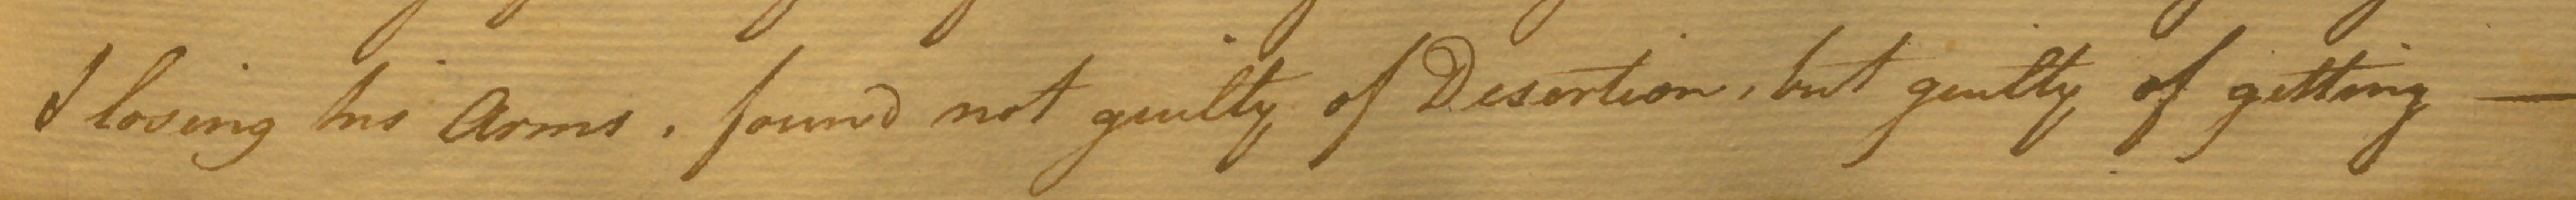& losing his Arms. found not guilty of Desertion, but guilty of getting-
